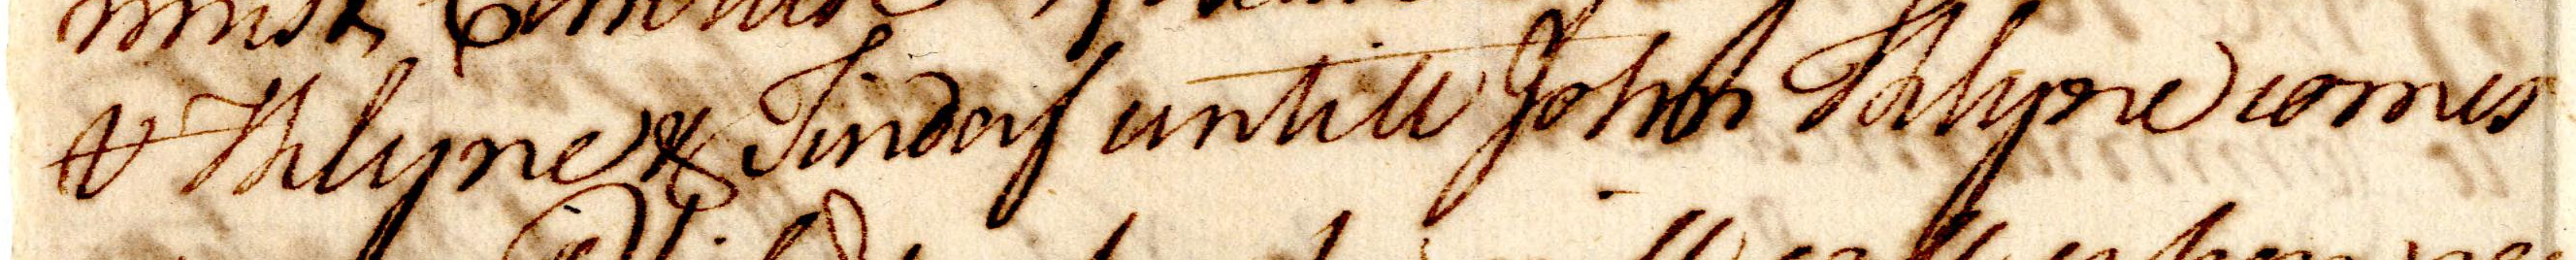& Thlyne & Tindorf untill John Thlyne comes
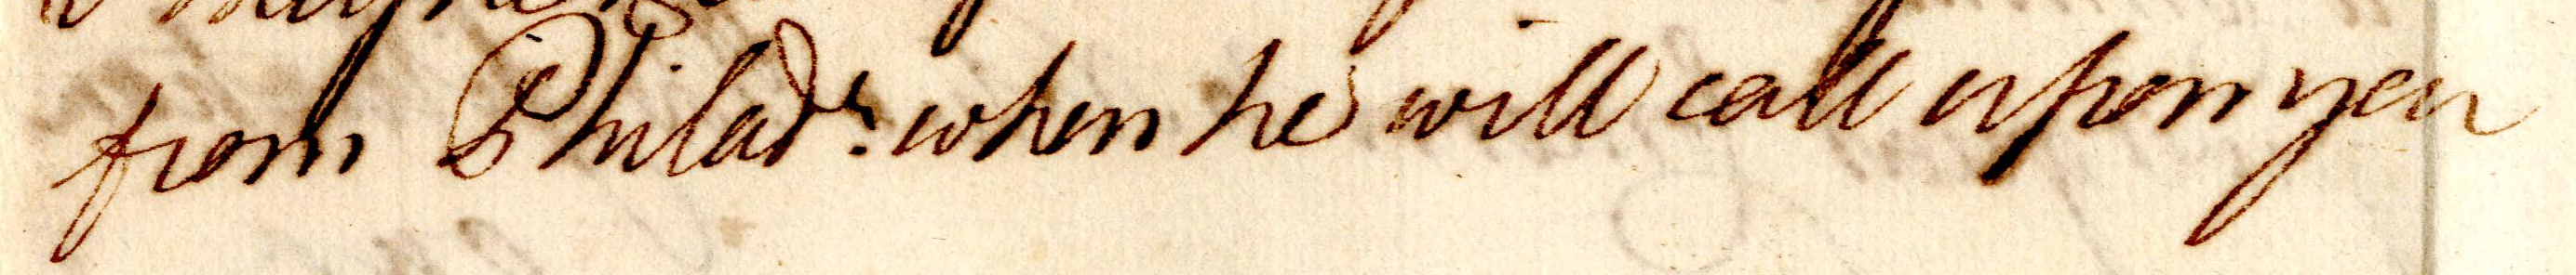from Philad^a. when he will call upon you
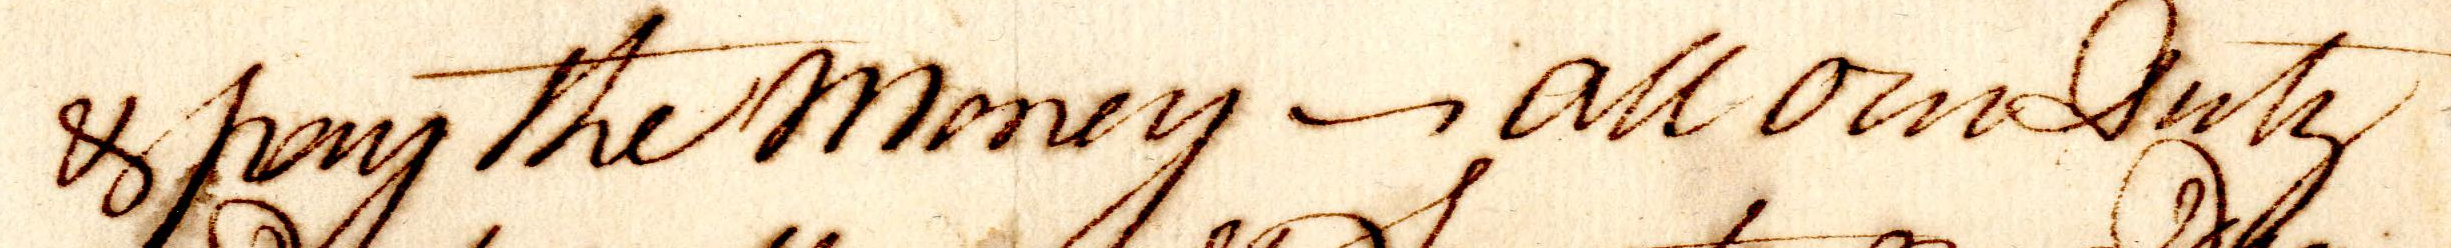& pay the Money. All our Duty
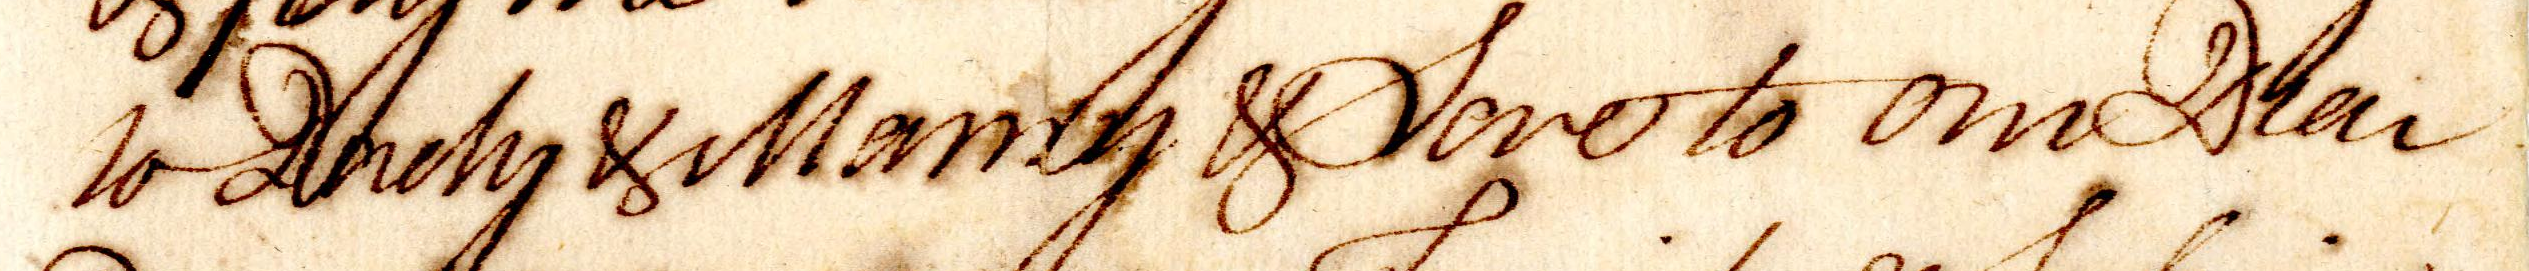to Duly & Mamy & Love to our Dear
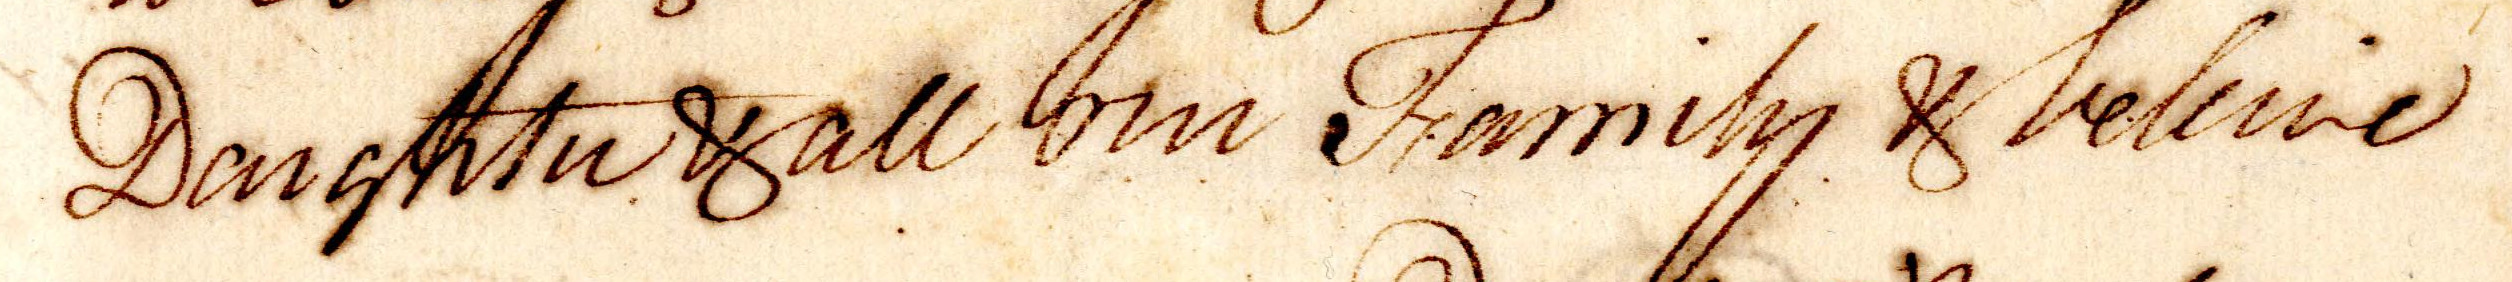Daughter &all our Family & believe
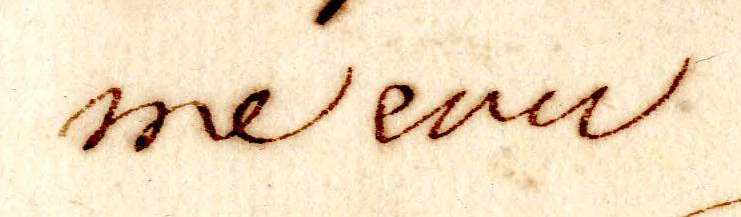me ever
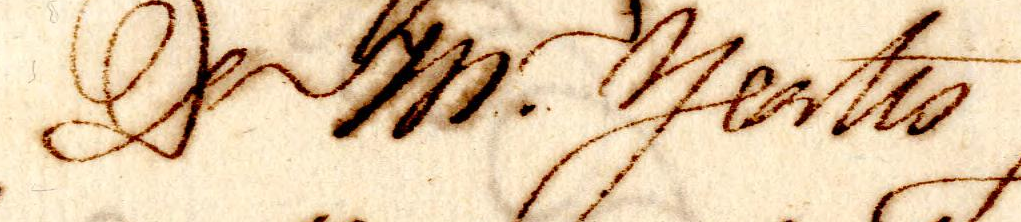D^r. M^r. Yeates
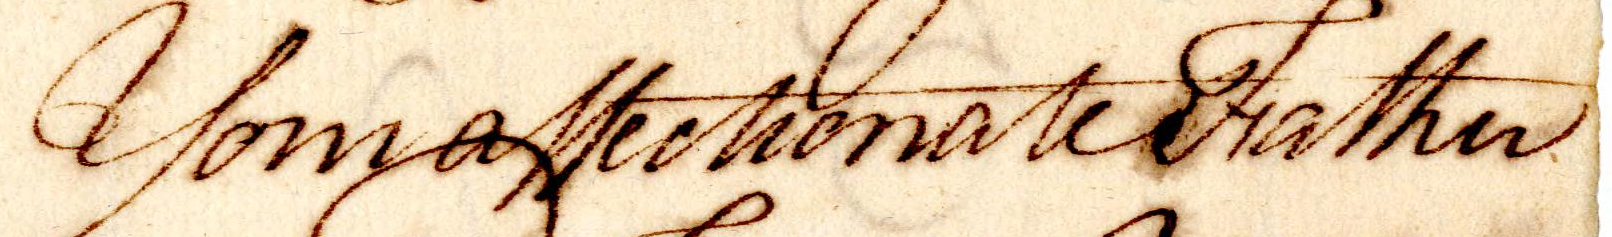Your affectionate Father
